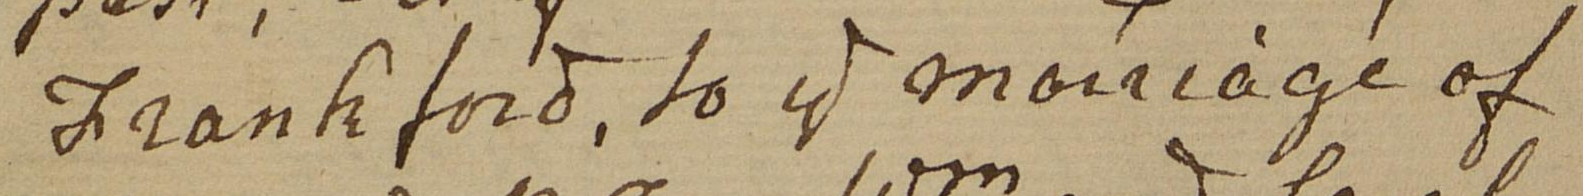Frankford, to y^e marriage of
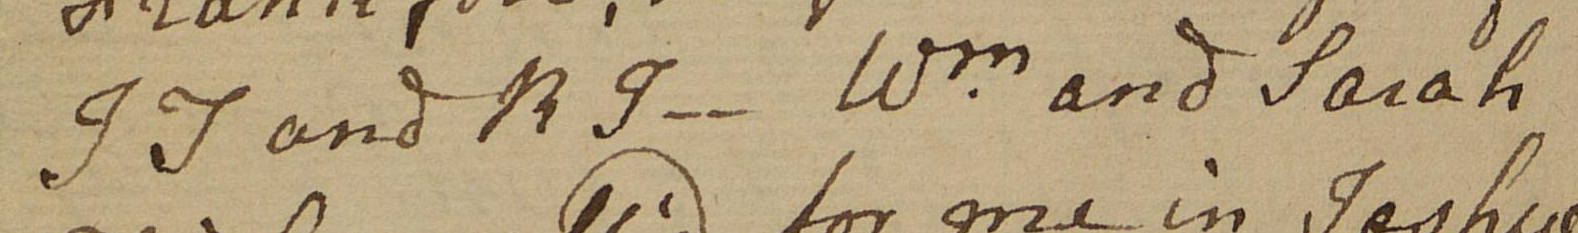JJ and RJ-- W^m. and Sarah
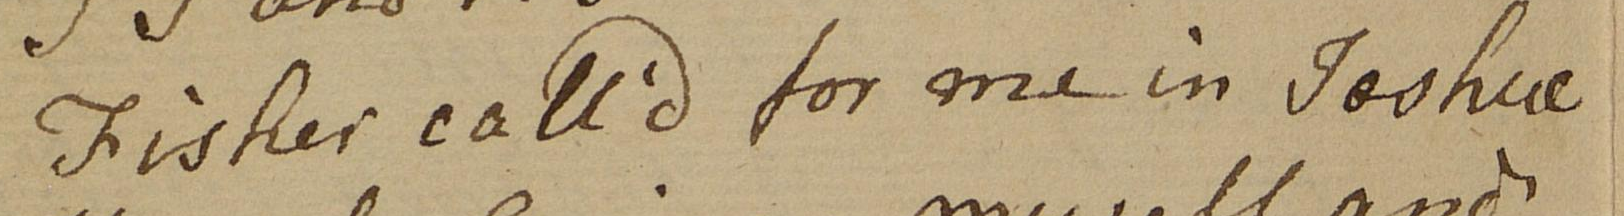Fisher call'd for me in Joshua,
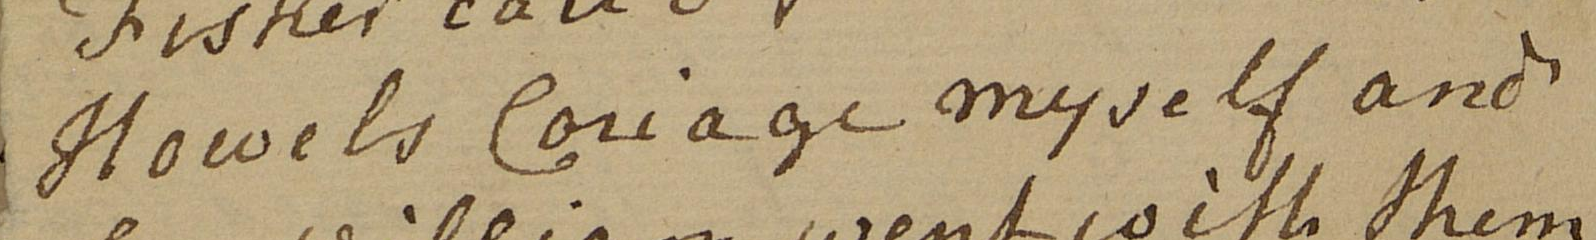Howels Cariage myself and
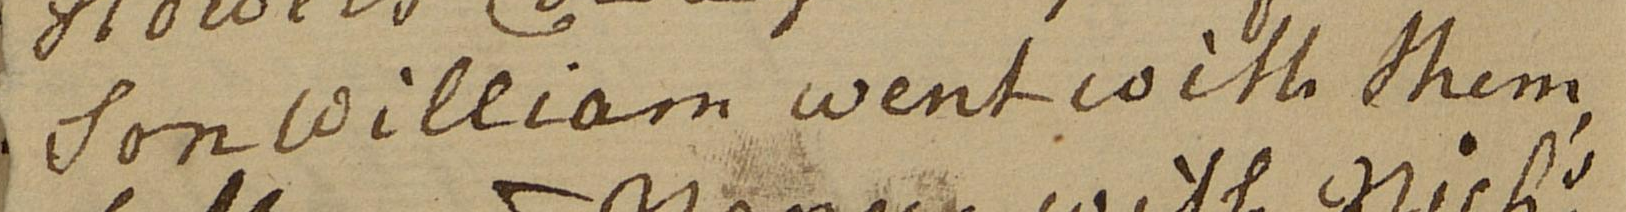Son William went with them,
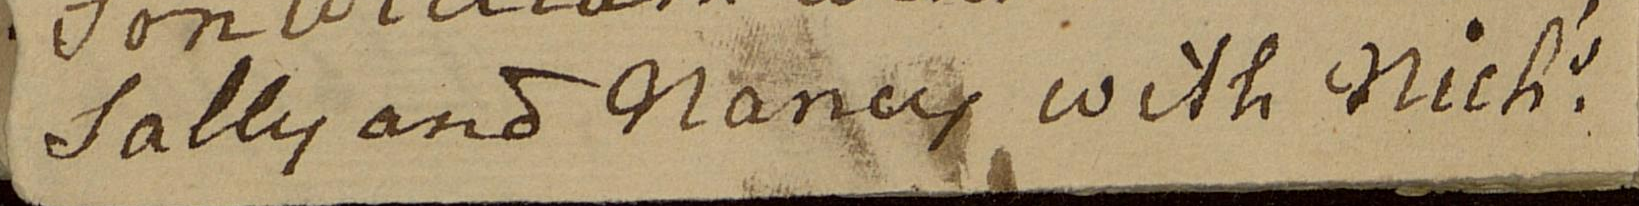Sally and Nancy with Nich^s.
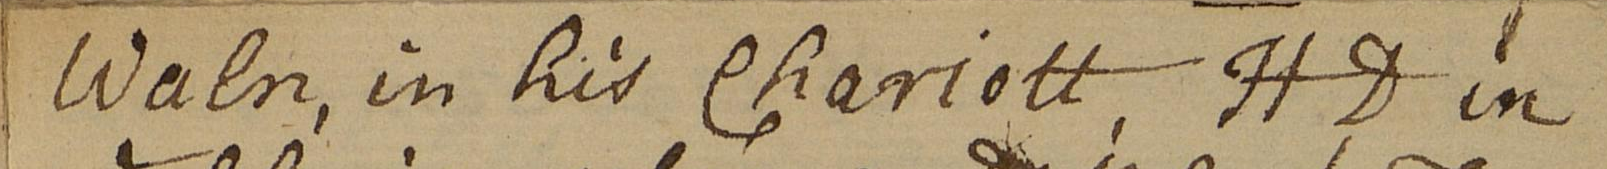Waln, in his Chariott, HD in
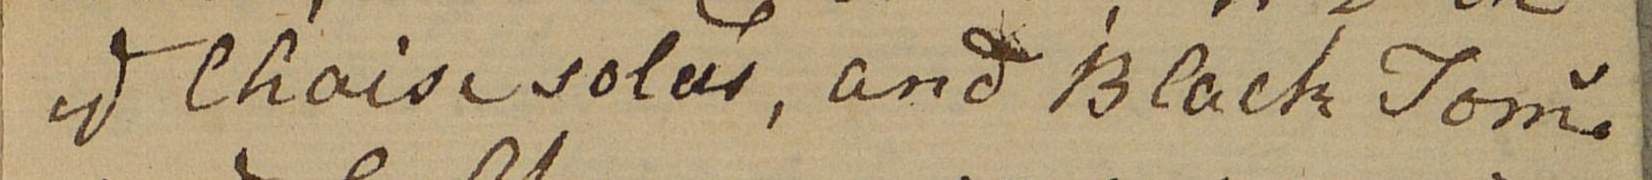y^e Chaise solas, and Black Tom^s.
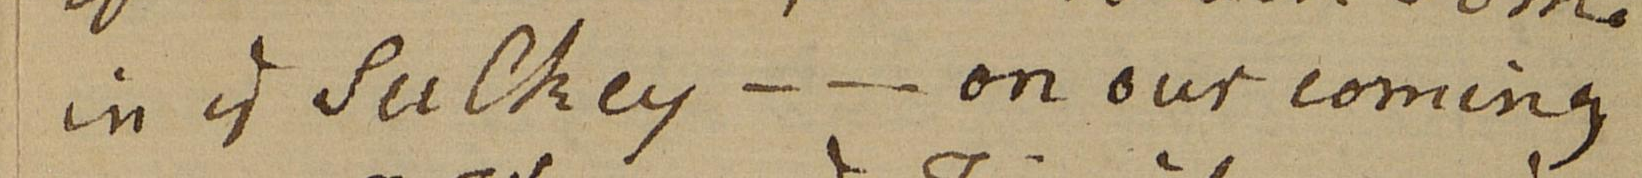in y^e Sulkey-- on our coming
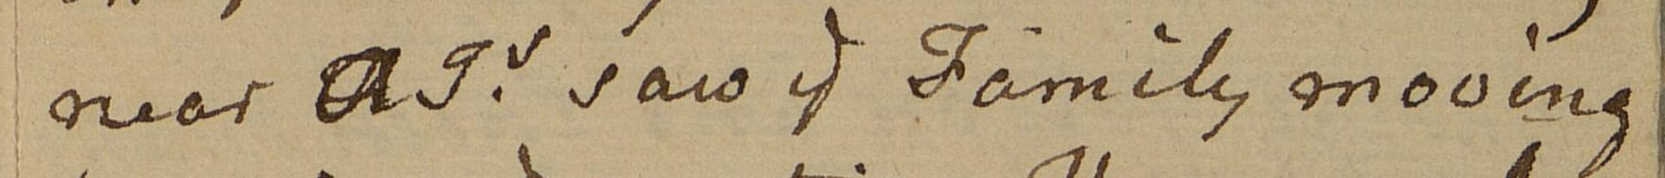near A J^s. saw y^e Family moving
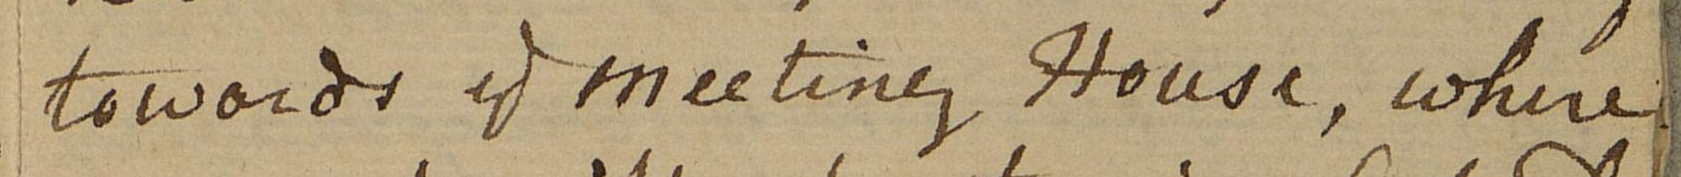towards y^e meeting House, where
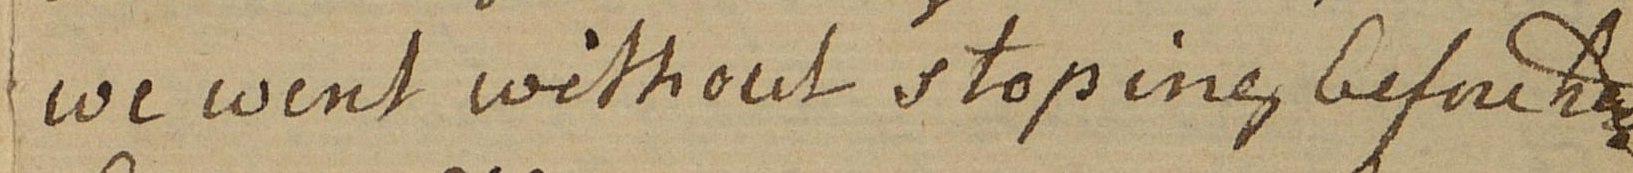we went without stopping before he
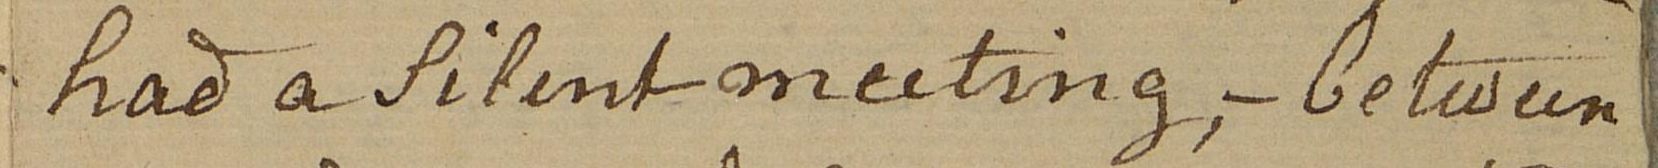had a Silent meeting- between
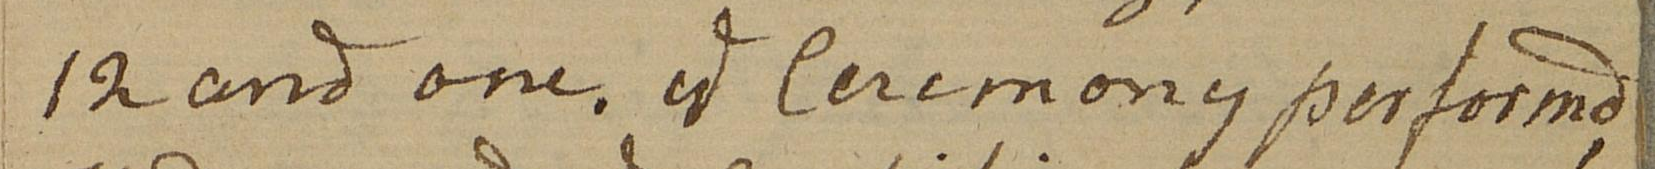12 and one, y^e Ceremony performd,
